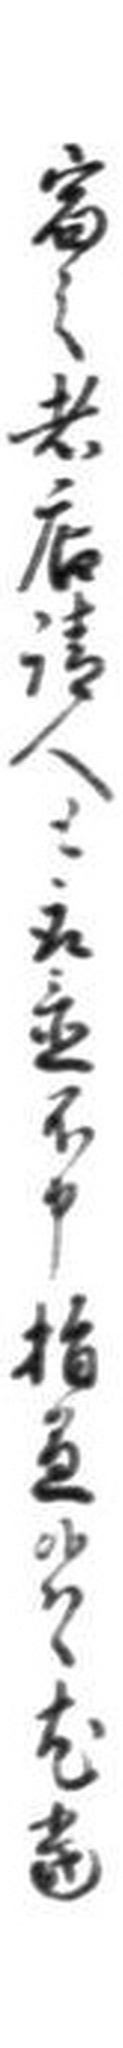宿之者店請人も取置不申指置候ハヽ尤当
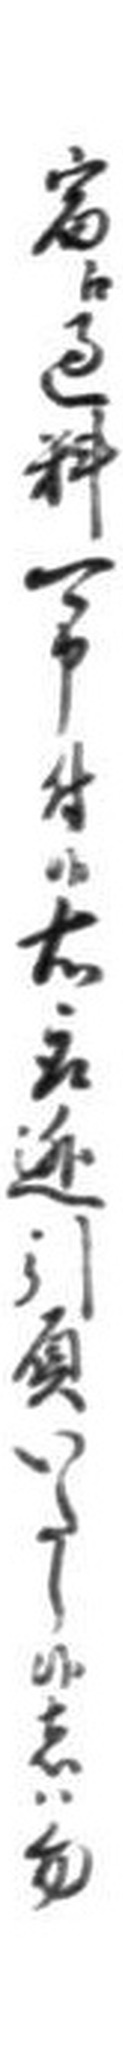宿江過料可申付候右取逃引負いたし候者ハ勿
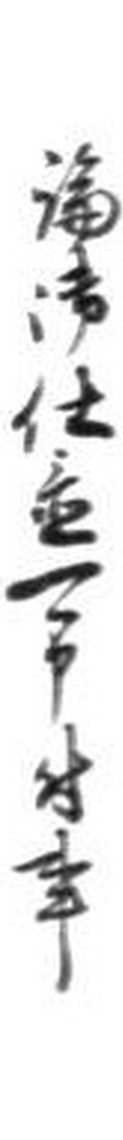論御仕置可申付事
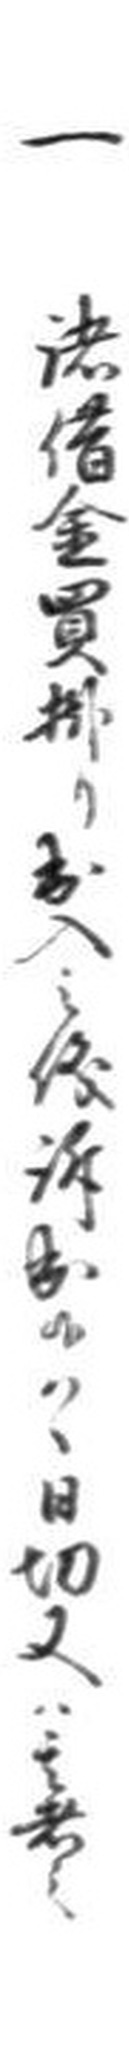一諸借金買掛り出入之儀訴出候ハヽ日切又ハ其者之
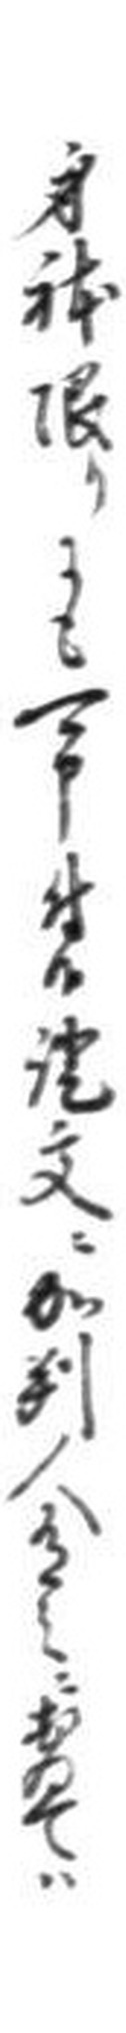身体限りにも可申付候証文ニ加判人有之ニおゐてハ

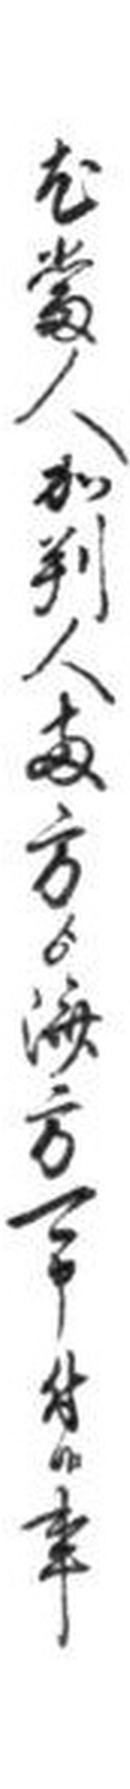尤当人加判人両方ゟ済方可申付候事
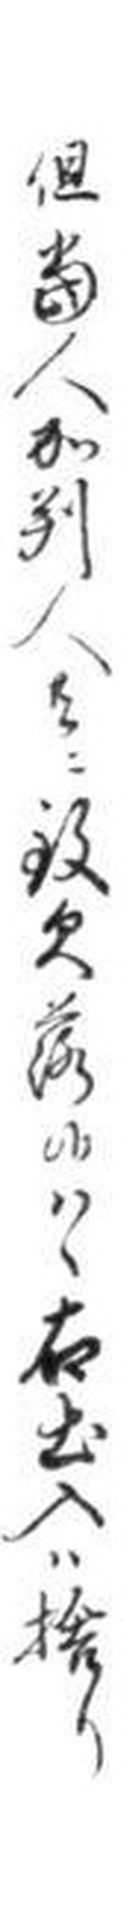但当人加判人共ニ致欠落候ハヽ右出入ハ捨り
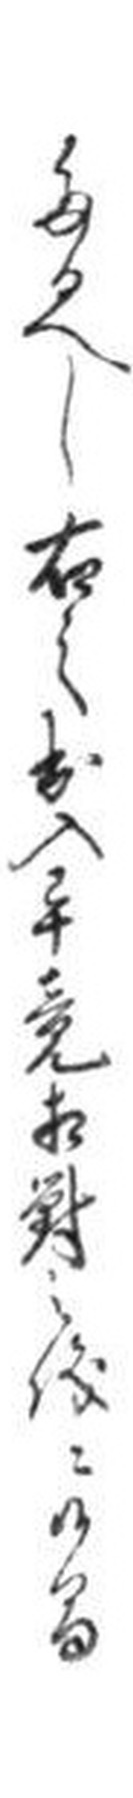たるへし右之出入畢竟相対之儀ニ候間
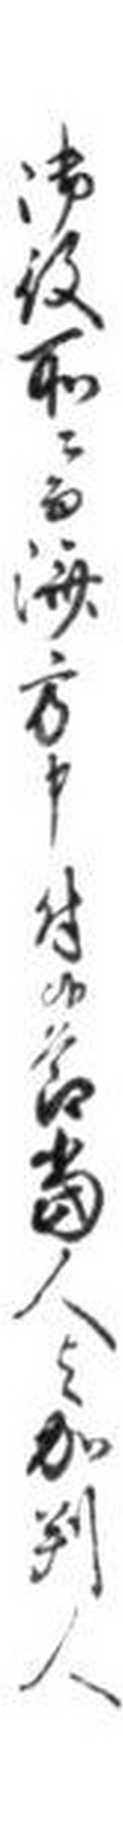御役所ニ而済方申付候節当人与加判人
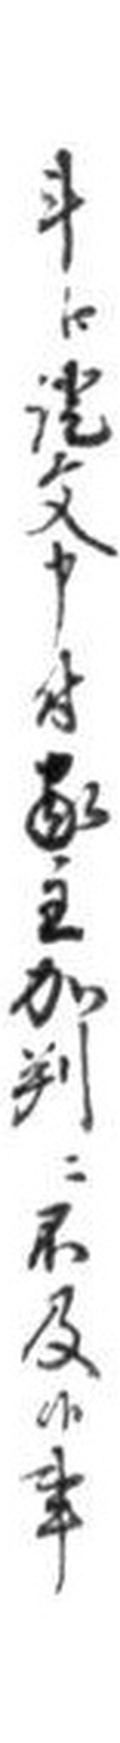斗江証文申付家主加判ニ不及候事
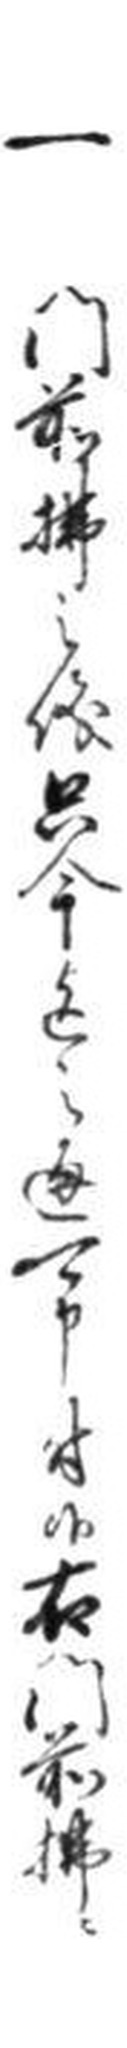一門前払之儀只今迄之通可申付候右門前払ニ
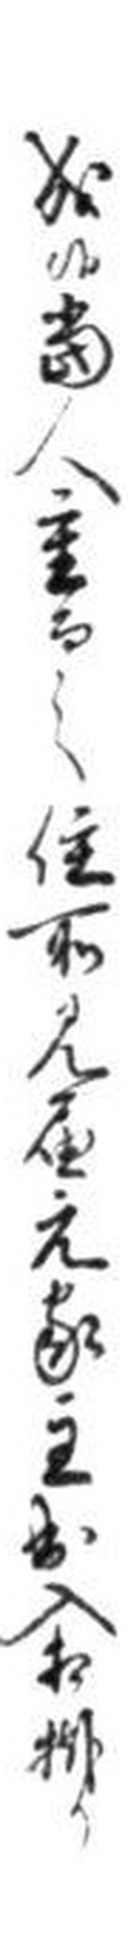成候当人重而之住所見届元家主出入相掛り
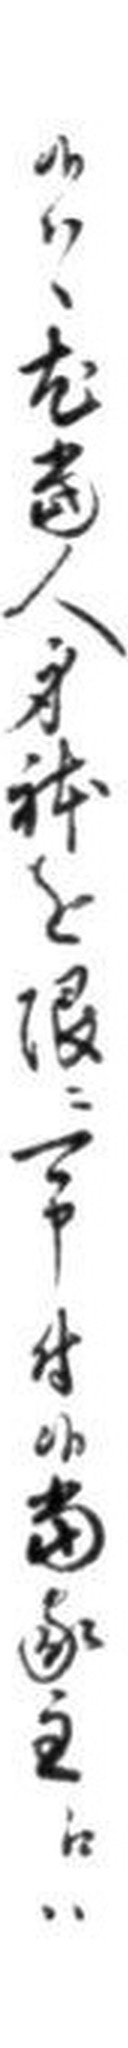候ハヽ尤当人身体を限ニ可申付候当家主江ハ
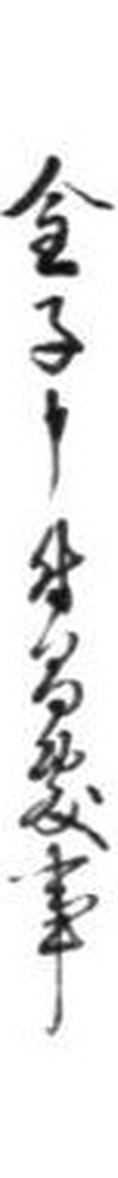金子申付間敷事
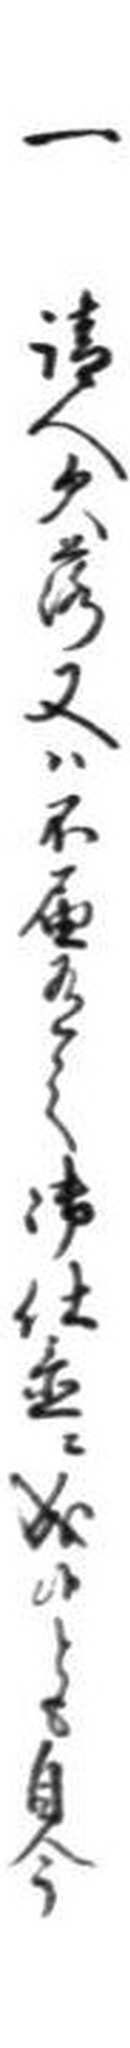一請人欠落又ハ不届有之御仕置ニ成候とも自今
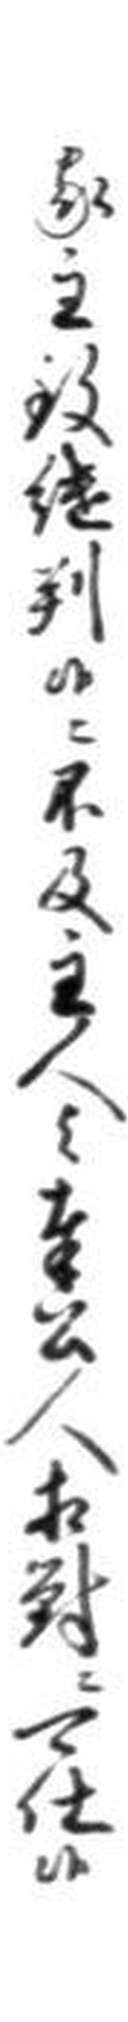家主致継判候ニ不及主人者奉公人相対ニ可仕候
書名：家譜 三十三 吉邦公 享保四年
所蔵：福井県文書館 Fukui Prefectural Archives
